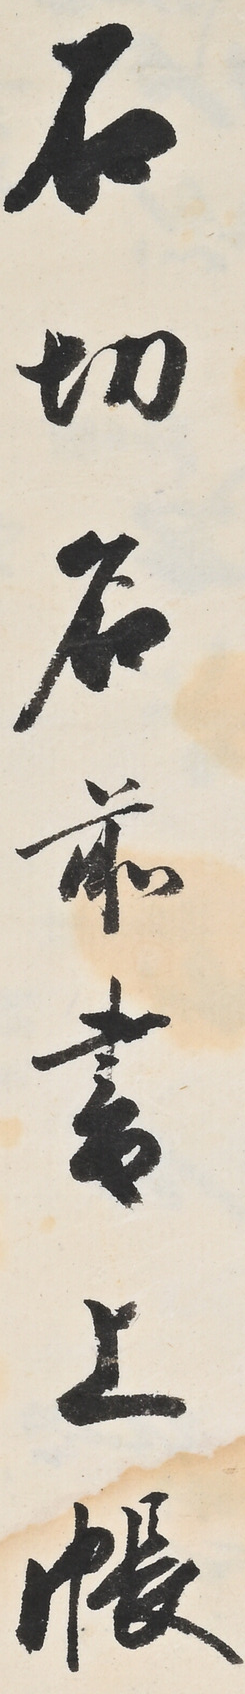石切名前書上帳
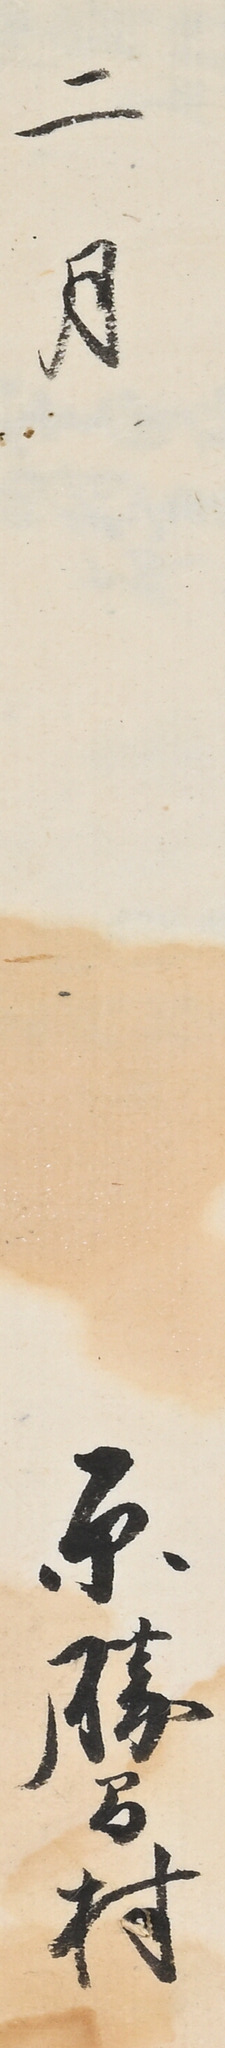二月原勝間村

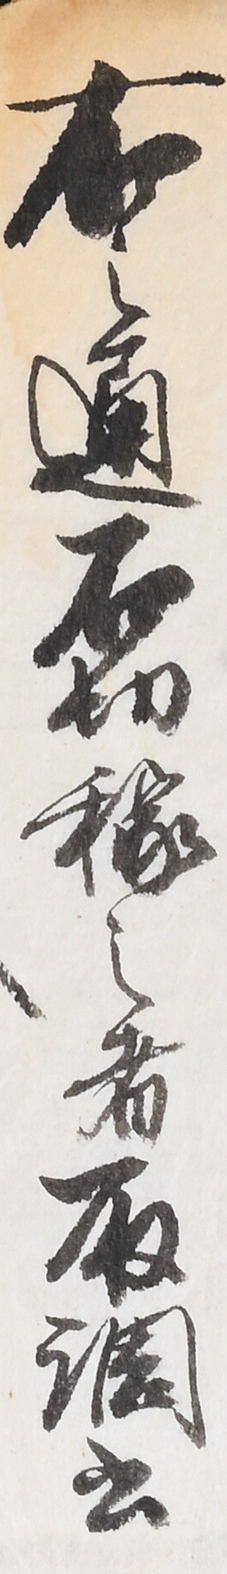右之通石切稼之者取調書
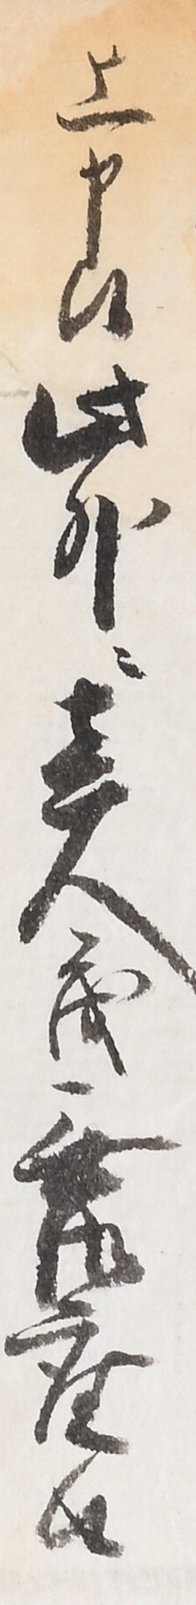上申候此外ニ壱人も無御座候
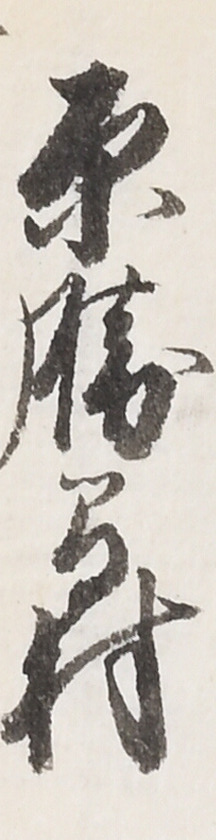原勝間村
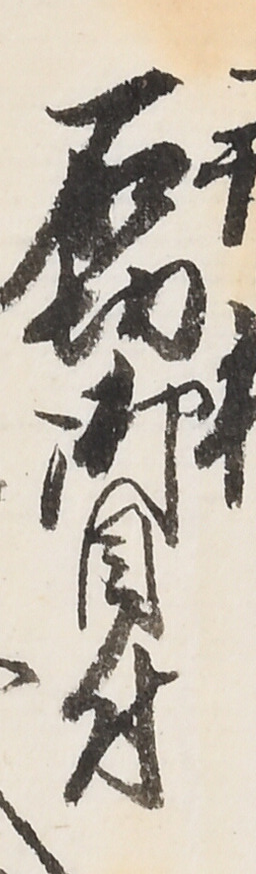石切御目付
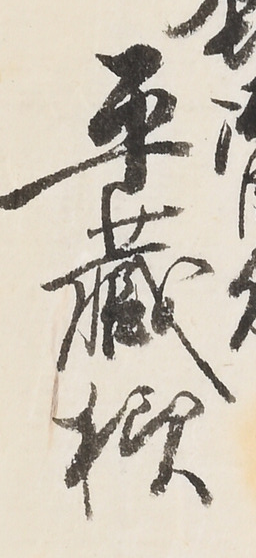平蔵様
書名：文久二壬戌年二月石切名前書上帳
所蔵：伊那市立高遠町図書館・合同会社AMANE
